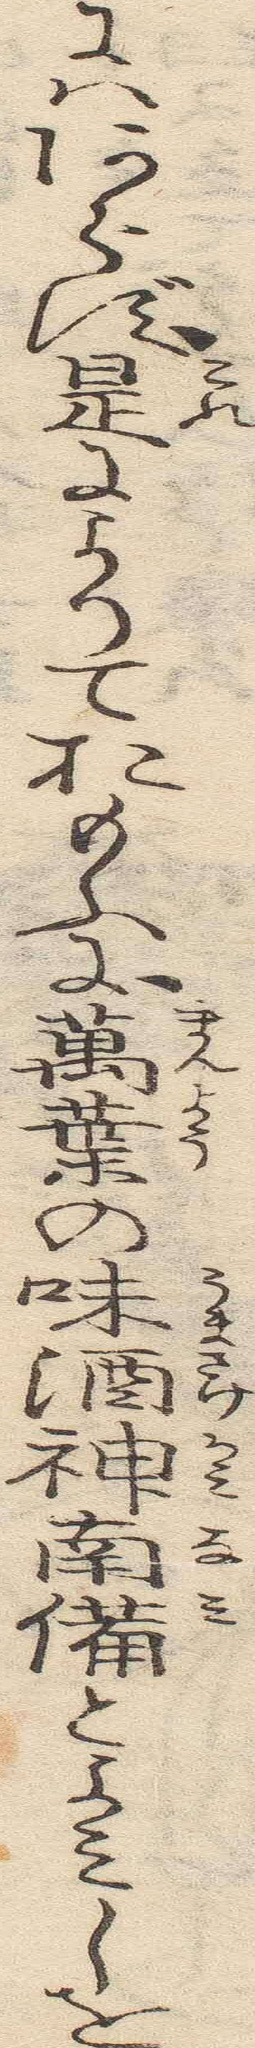にはあらず。是によりておもふに。万葉の味酒神南備とよみしを
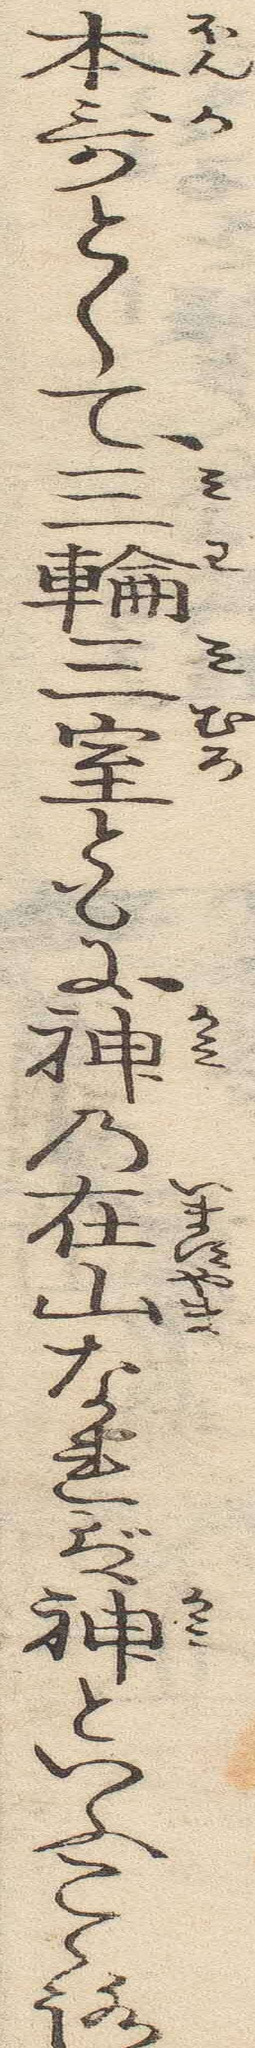本哥として。三輪三室ともに。神の在山なれば神といふこゝろ
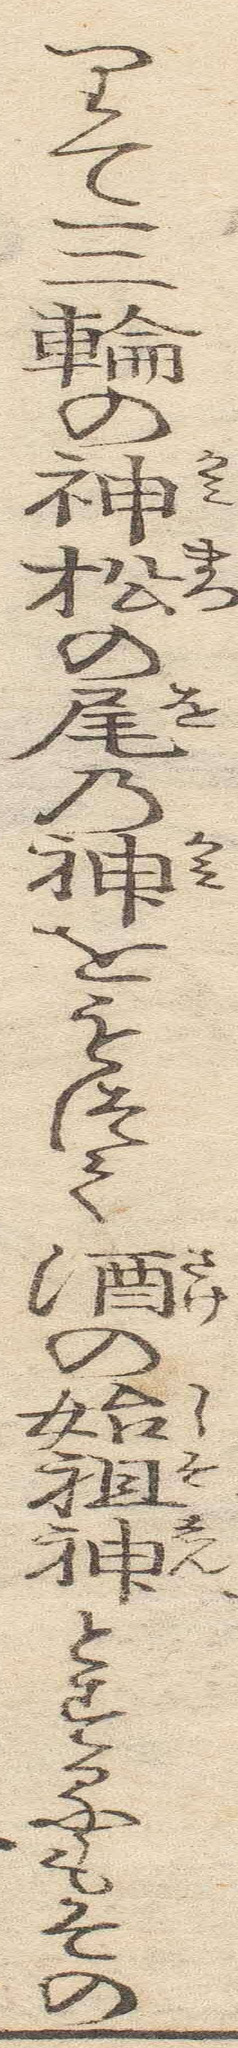りて三輪の神松の尾の神をもつて酒の始祖神とするにもその
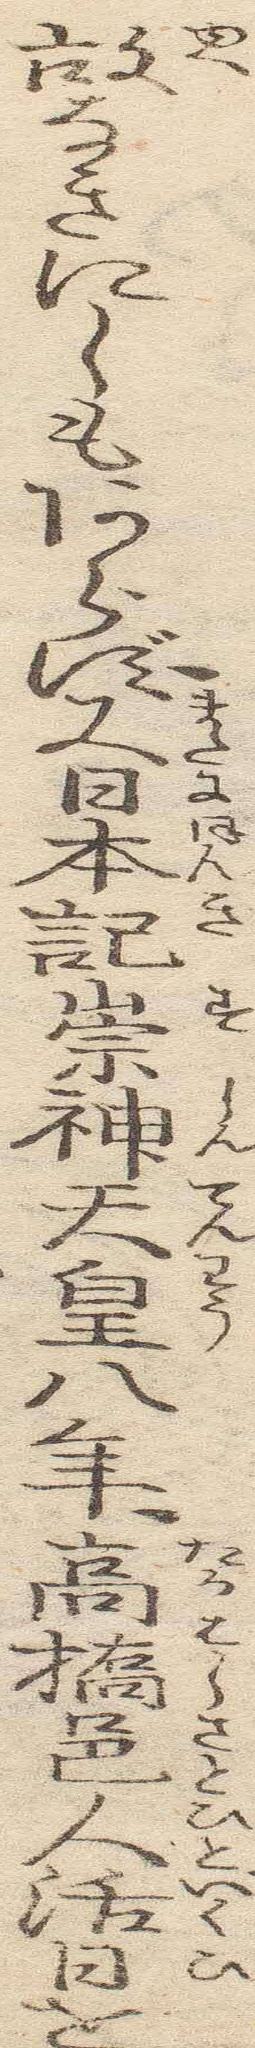故なきにしもあらず。又日本記崇神天皇八年。高橋邑人。活日を
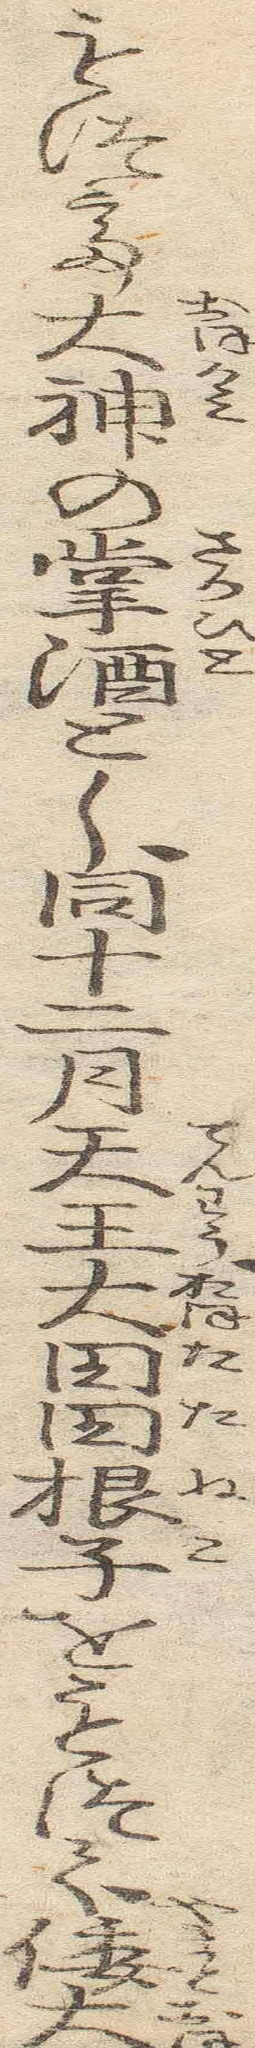もつて大神の掌酒とし。同十二月天王。大田田根子をもつて。倭大
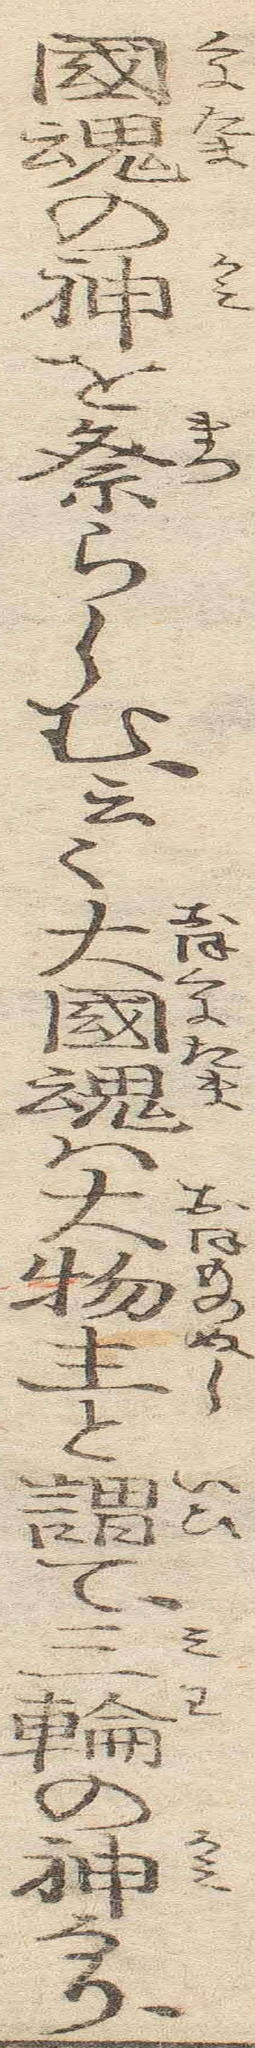国魂の神を祭らしむ。云々大国魂は大物主と謂て。三輪の神なり。
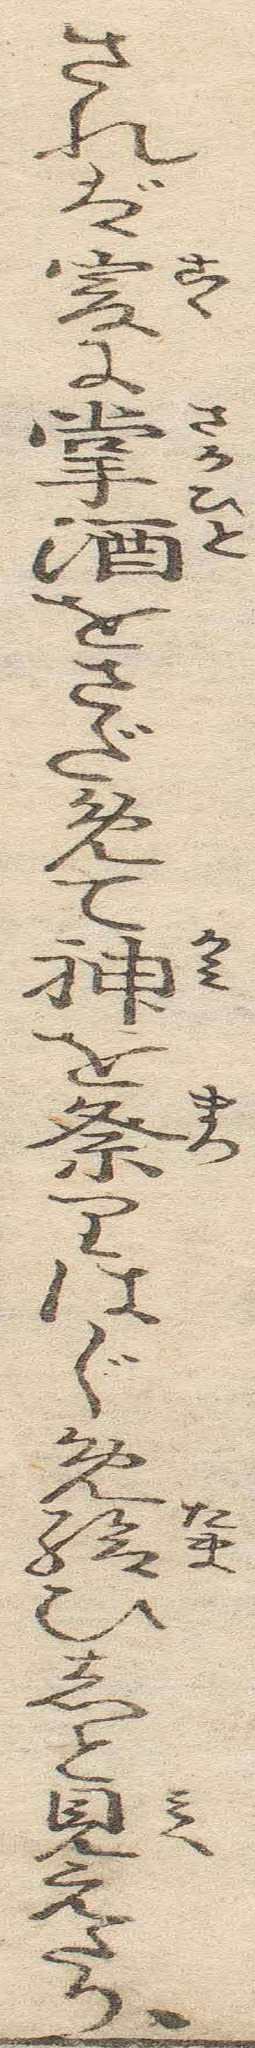されば爰に掌酒をさだめて神を祭りはじめ給ひしと見えたり。
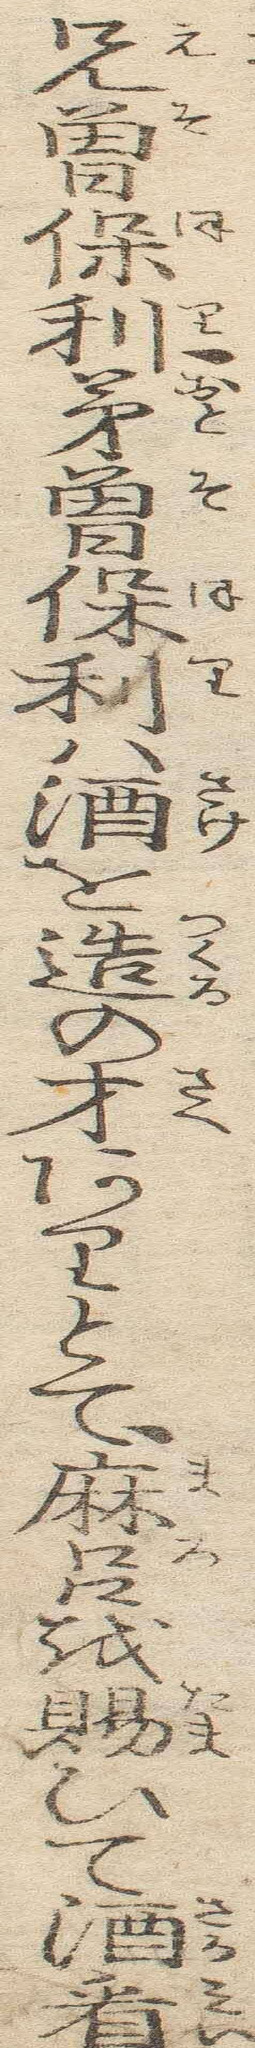兄曽保利。弟曽保利は酒を造の才ありとて。麻呂を賜ひて酒看
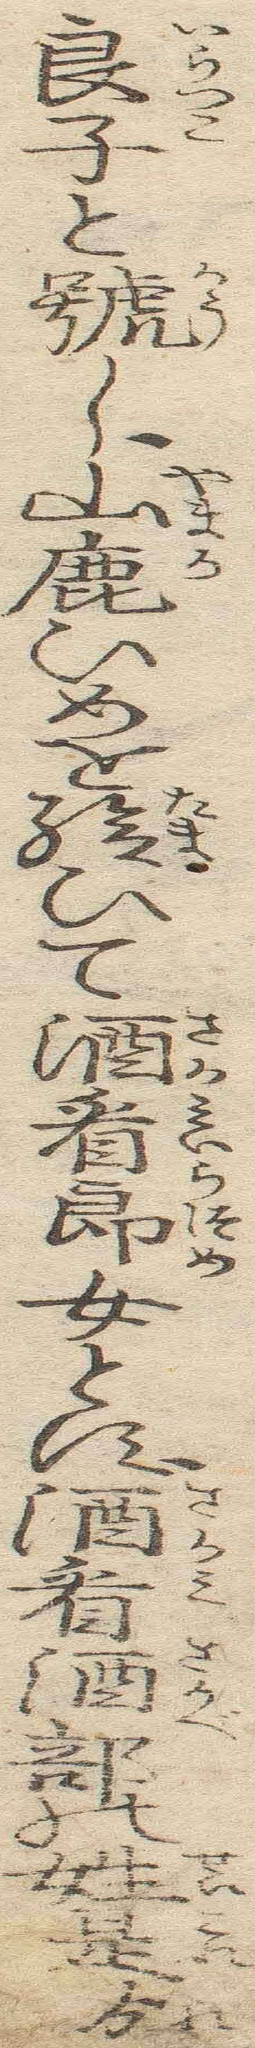良子と号し。山鹿ひめを給ひて酒看郎女とす。酒看酒部の姓是ゟ
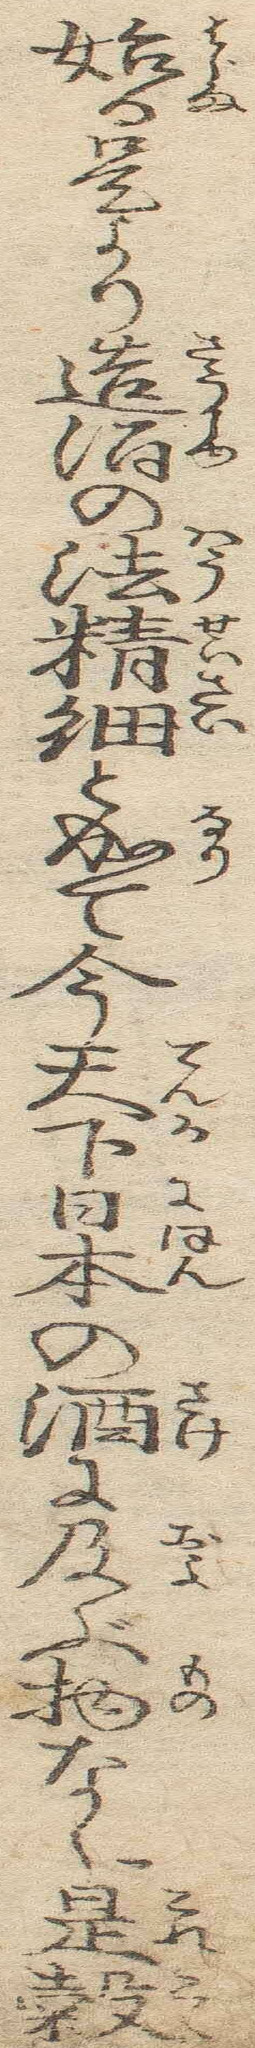始る是より造酒の法精細と成て今天下日本の酒に及ぶ物なし。是穀
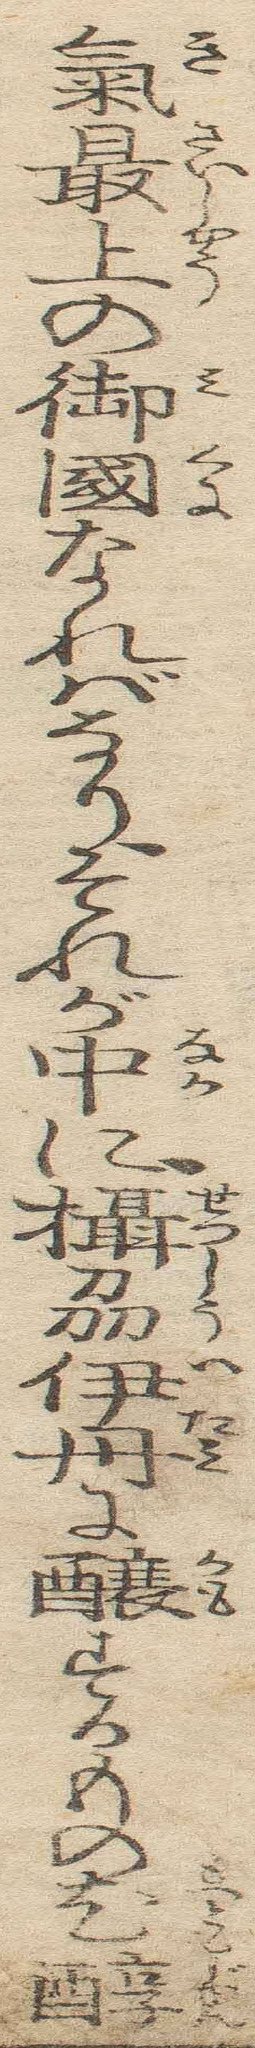気最上の御国なればなり。それが中に。摂州伊丹に醸するもの尤醇
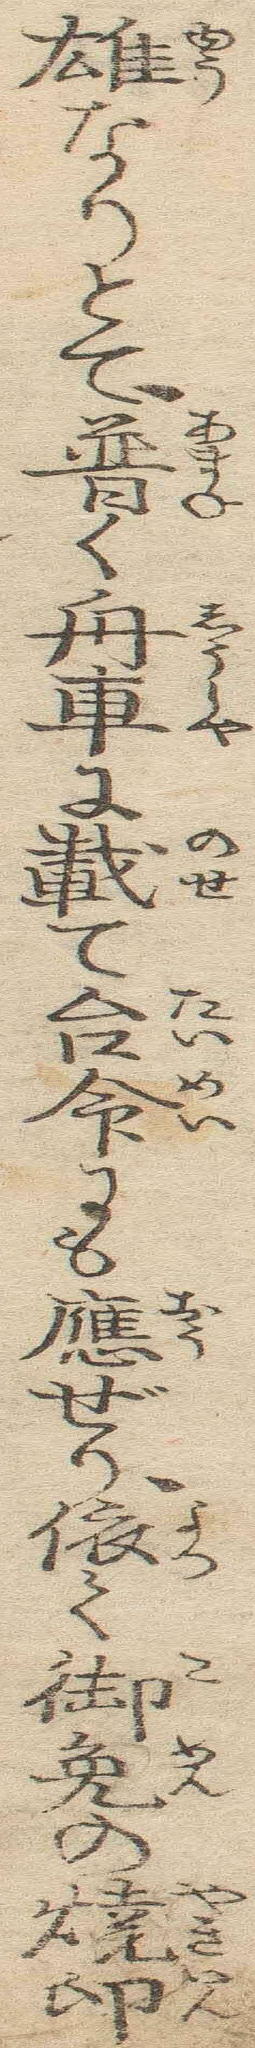雄なりとて。普く舟車に載て台命にも応ぜり。依て御免の焼印
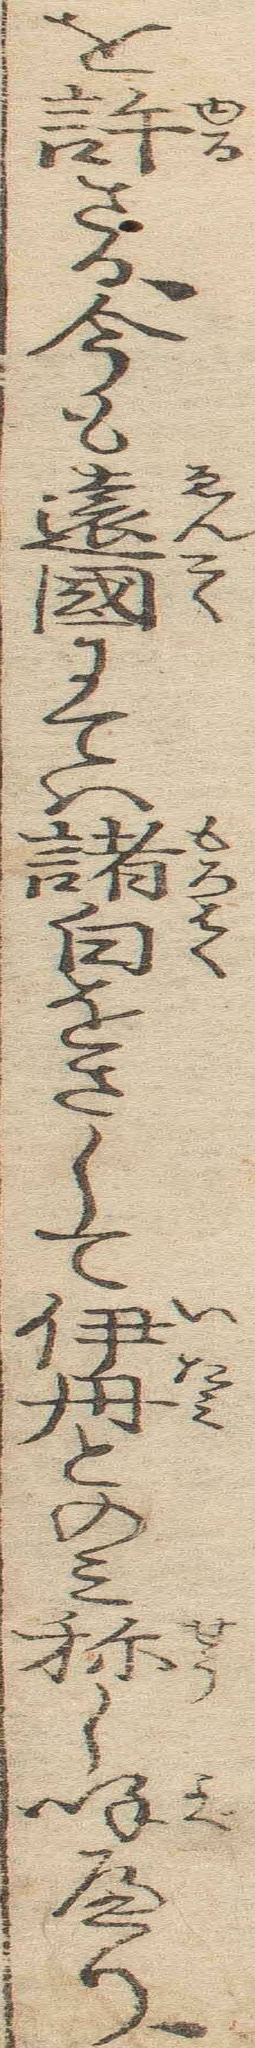を許さる。今も遠国にては諸白をさして伊丹とのみ称し呼へり。

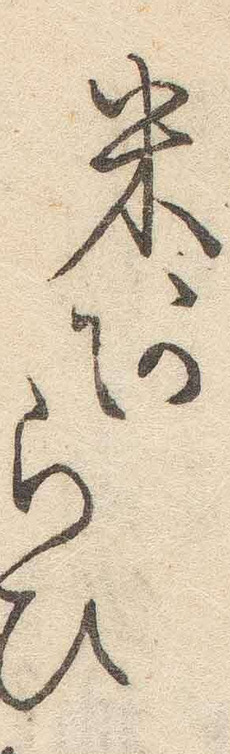米あらひ
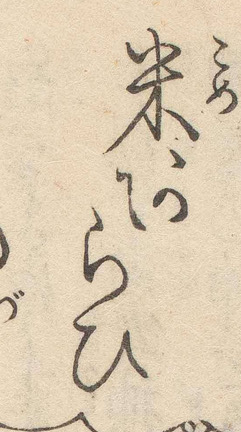米あらひ

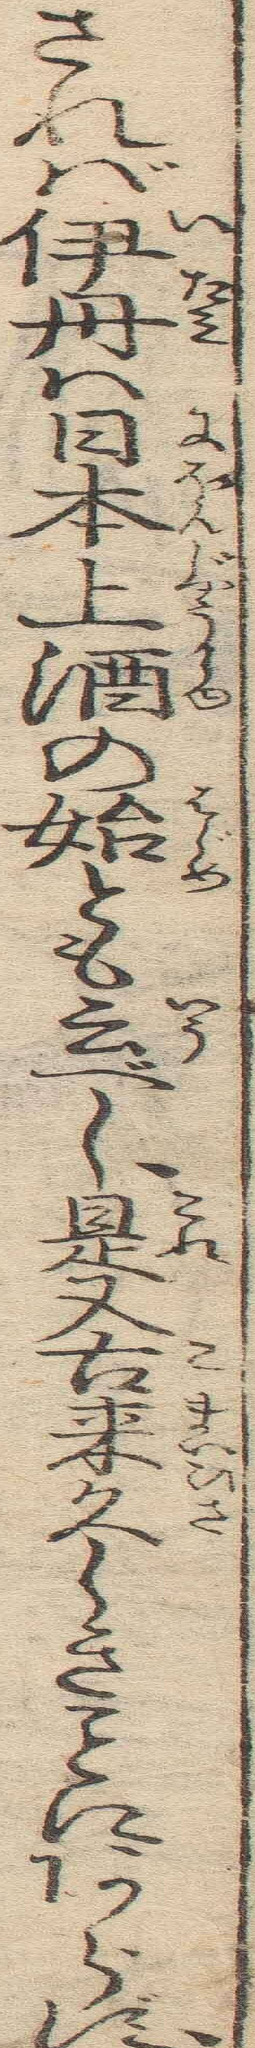されば伊丹は日本上酒の始とも云べし。是又古来久しきことにあらず。
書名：日本山海名産図会
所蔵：東京学芸大学附属図書館 国文学研究資料館
